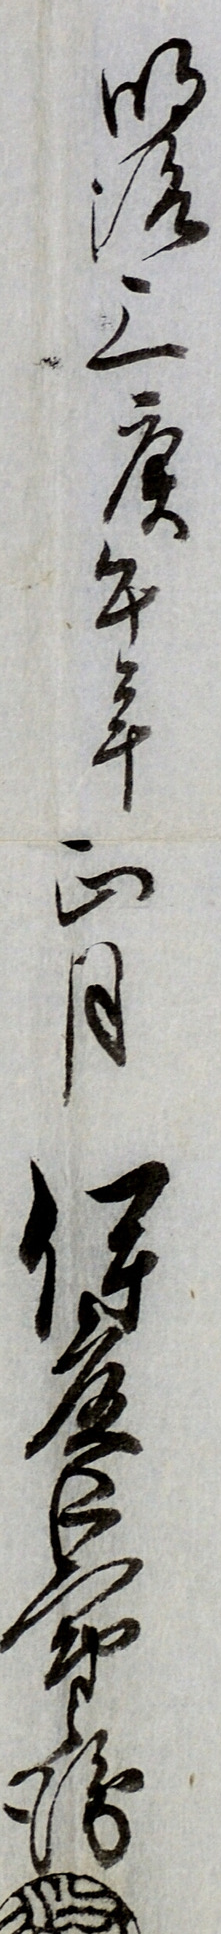明治三庚午年正月伊藤四郎兵衛
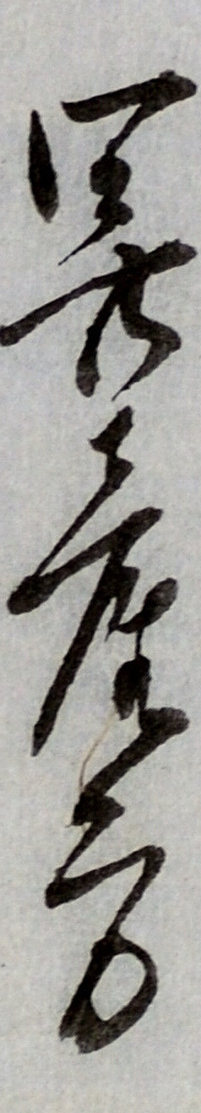開産方
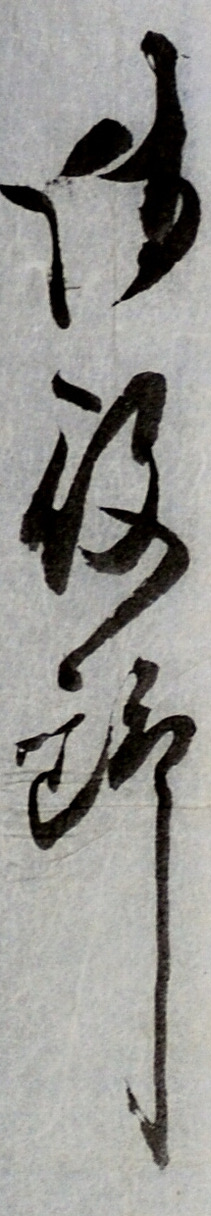御役所

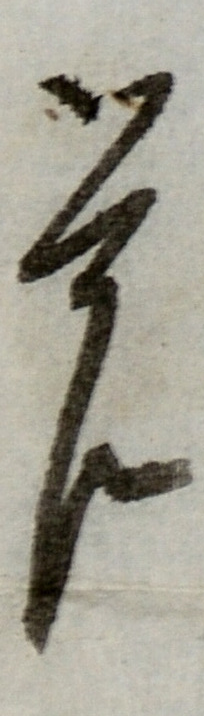御役所
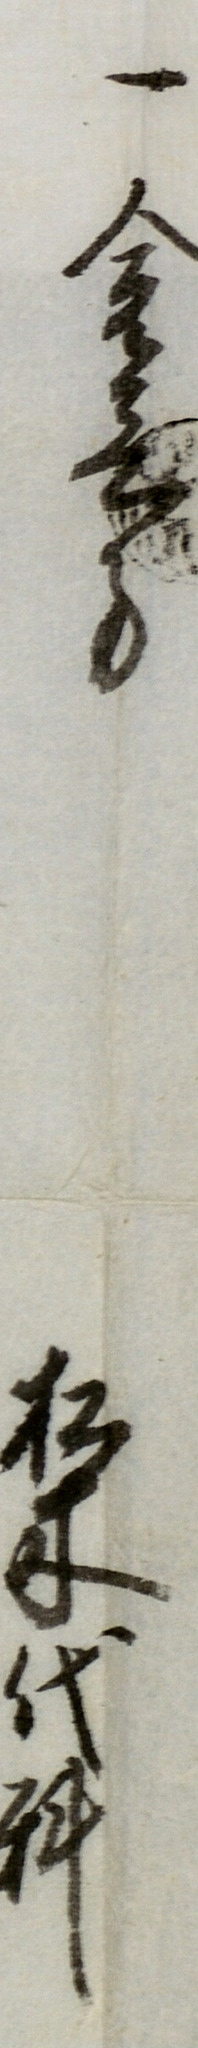一金壱分松木代料
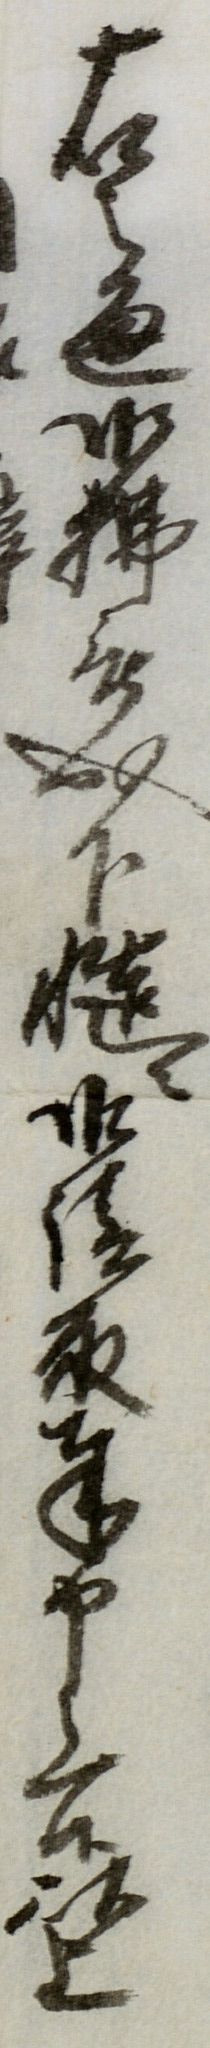右之通御払被成下慥ニ御請取奉申上候以上
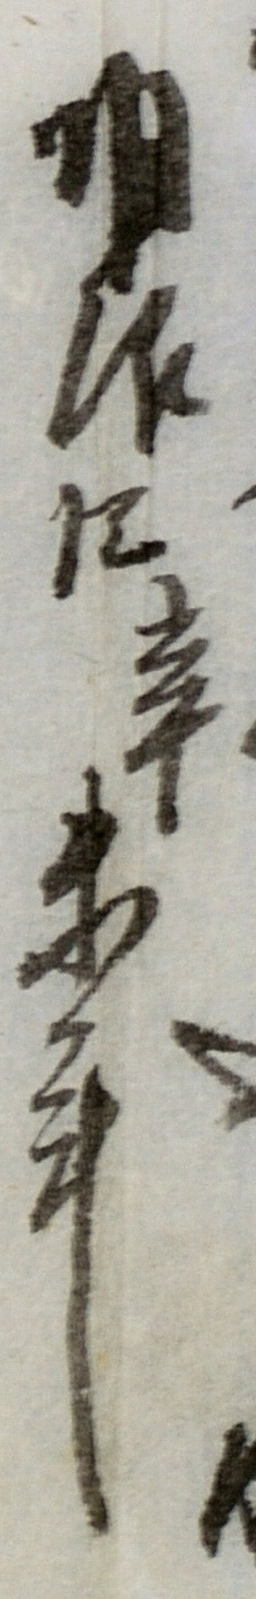明治四辛未年
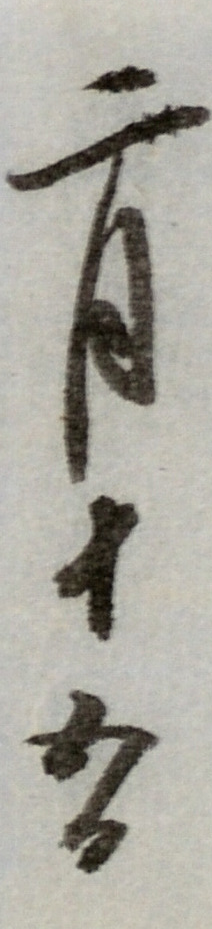二月十五日
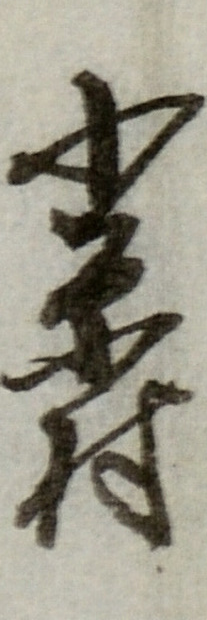小原村
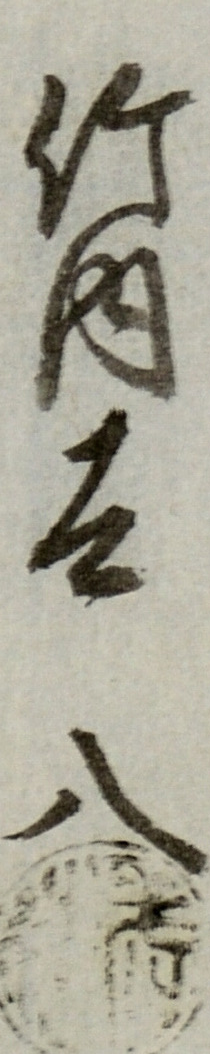竹内太八
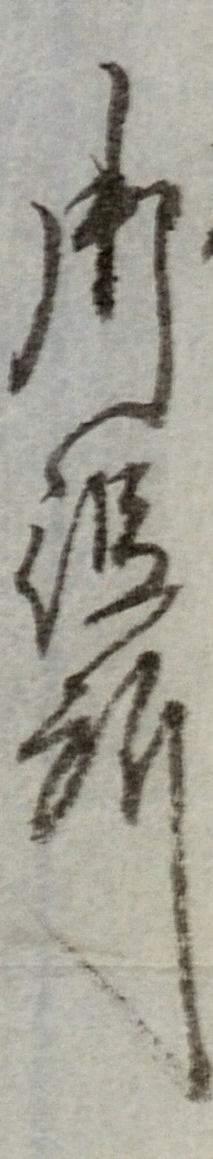御役所

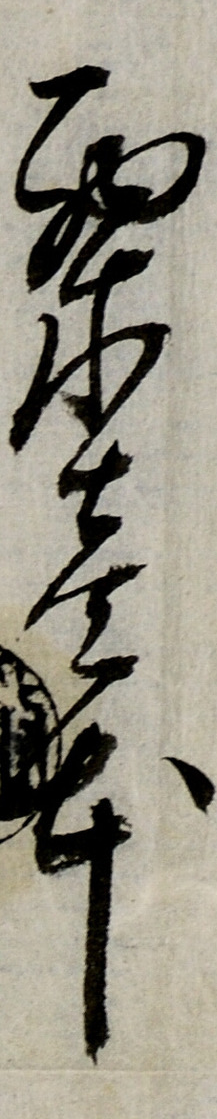栗木壱本
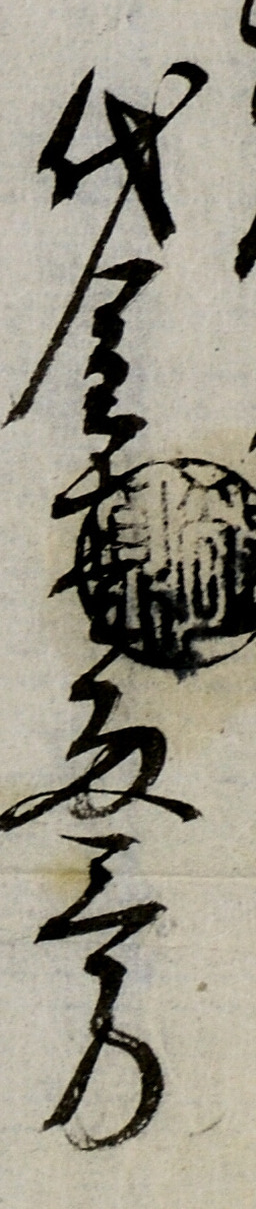代金壱両三分
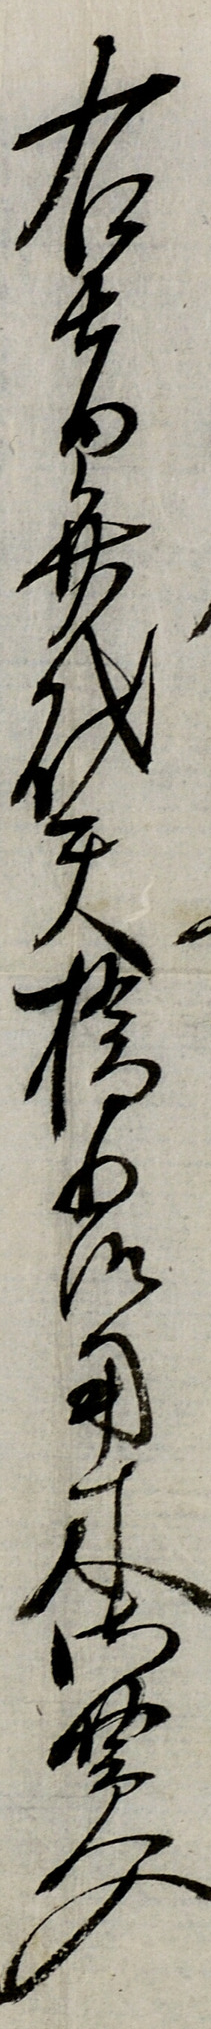右は弁財矢橋為御用木御買入
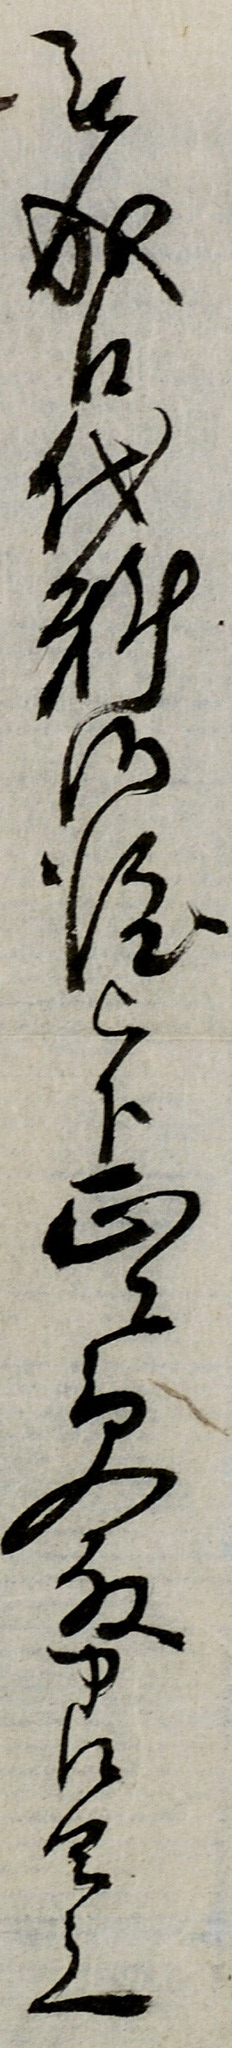被成候代料御渡被下正ニ受取申候以上
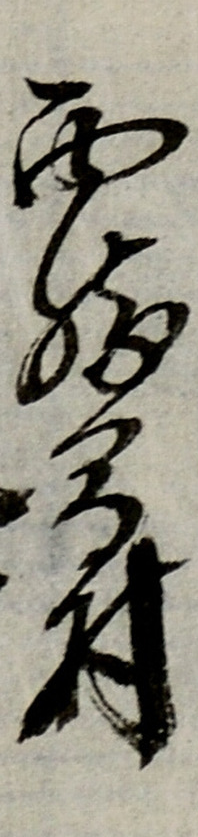西勝間村
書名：御山方御拂物代料取立帳
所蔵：伊那市立高遠町図書館・合同会社AMANE
